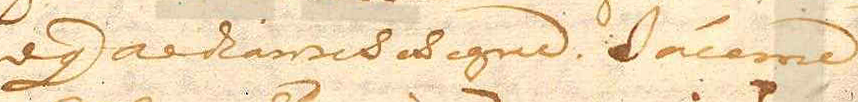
o q̄ ao diante se segue. Iácome
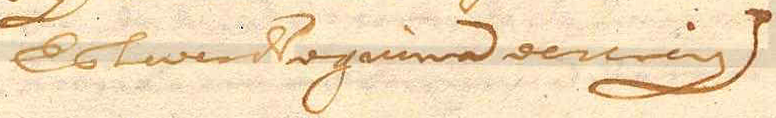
Esteves Nogueira o escreuj
